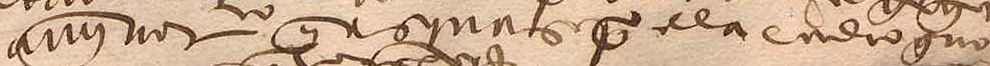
a mj̄ notro q̄ asynase p̄o ella e eu dioguo
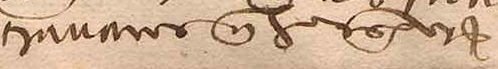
trauacos q̄ ho esp̄vy
